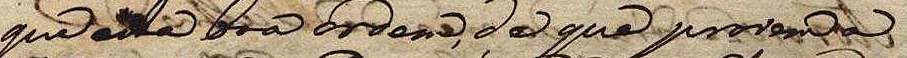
que esta boa ordem, de que provem a
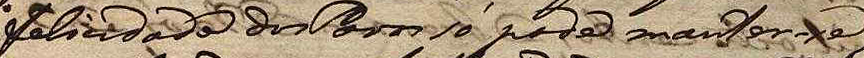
felicidade dos Povos só pode manter-se
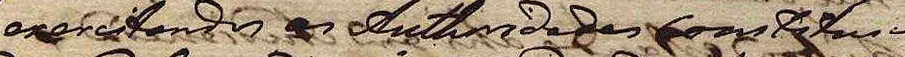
exercitando as Authoridades constitui
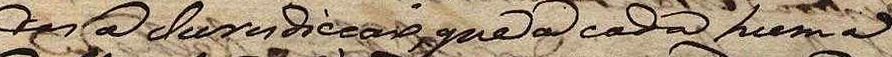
das a Iurisdicçaõ, que a cada huma
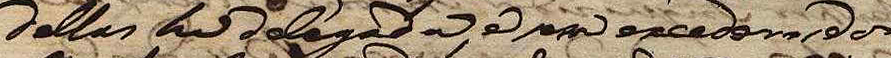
dellas he delegada, e sem excederesse os
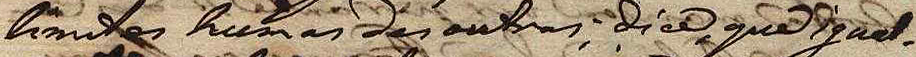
limites humas das outras; dice, que igual
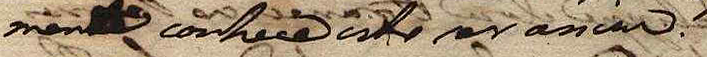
men__ conhece isto ser assim.
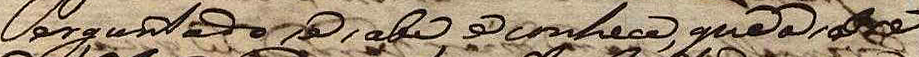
Perguntado se sabe, e conhece, que a sobre
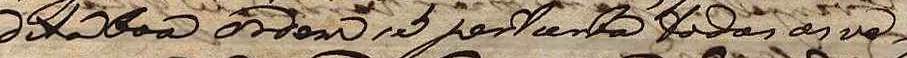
dita boa ordem se perturba todos as ve
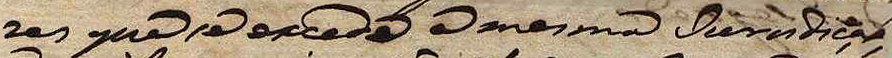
zes que se exçede a mesma Iurisdiçaõ,
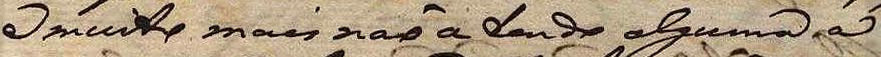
e muito mais naõ a tendo alguma a
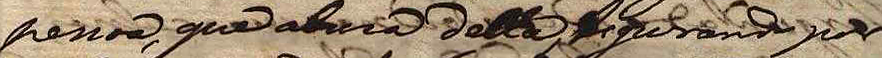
pessoa, que abuza della, figurando por
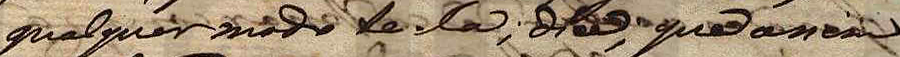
qualquer modo te-la, dice, que assim
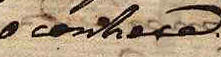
o conhece.
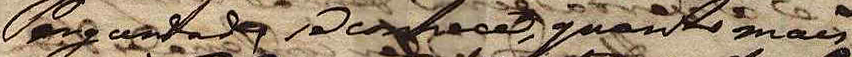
Perguntada se conhece, quanto maes
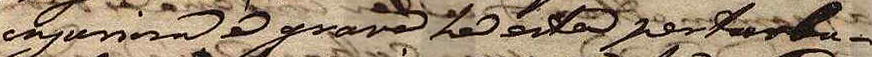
enjuriosa e grave he esta perturba
